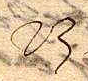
23
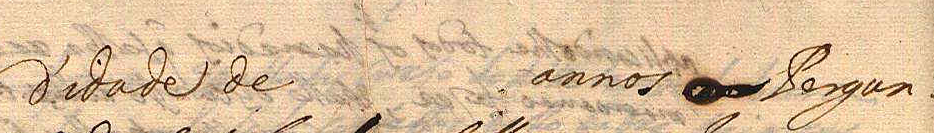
d'idade de annos _ Pergun
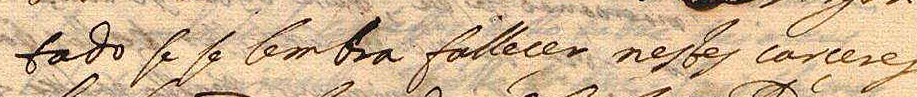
tado se se lembra falleçer nestes carçeres
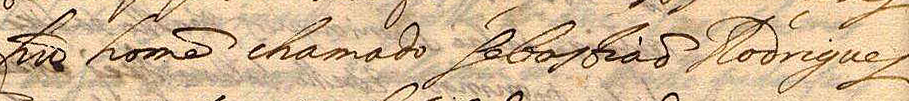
hū homē chamado sebastiaõ Rodrigues
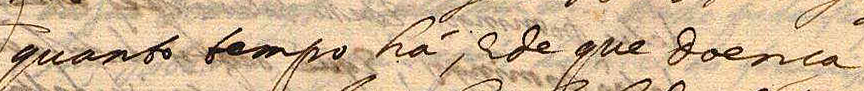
quanto tempo há, E de que doença
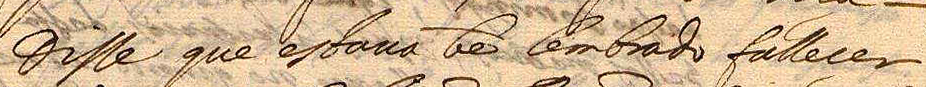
Disse que estaua bē lembrado falleçer
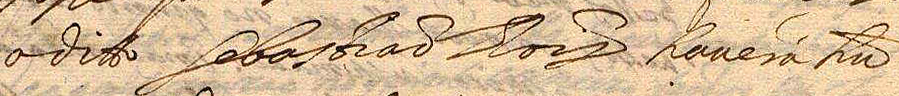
o ditto Sebastiaõ Roiz̄ hauerá hū
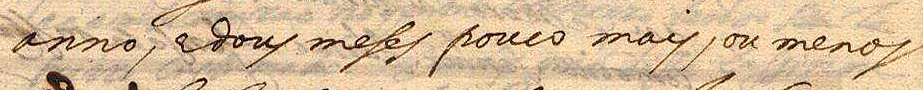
anno, E dous meses pouco mais, ou menos
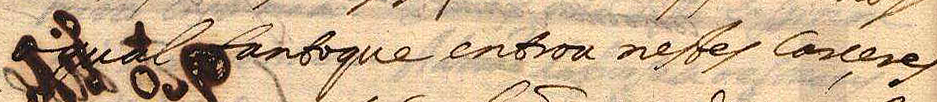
o qual tanto que entrou nestes carçeres
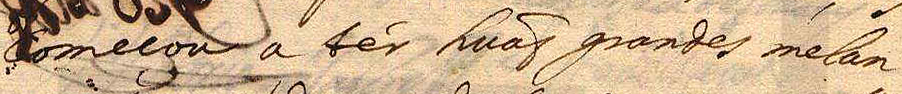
começou a ter huās grandes melan
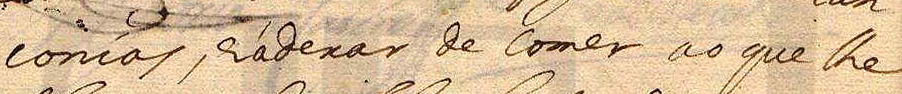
conias, e a dexar de comer ao que lhe
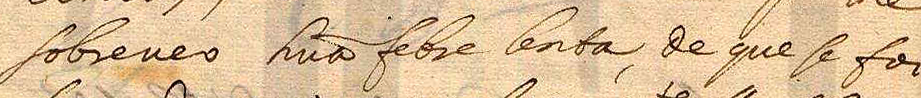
sobreueo huā febre lenta, de que se foi
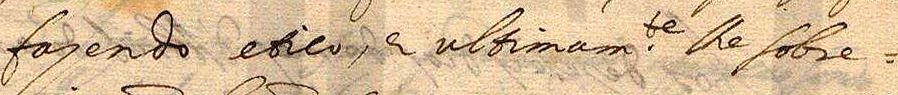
fazendo etico, E ultimam.te lhe sobre
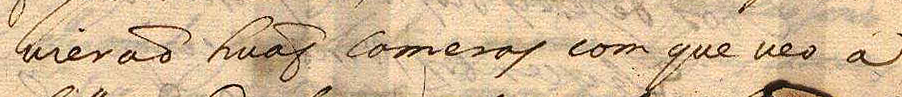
uieraõ huās cameras com que ueo a
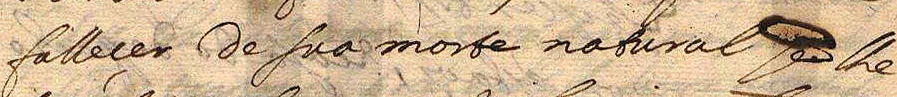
falleçer de sua morte natural sē lhe
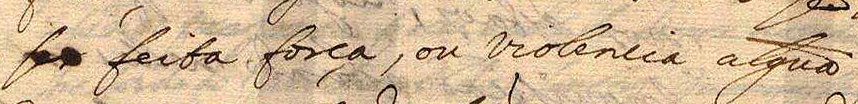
ser feita força, ou violencia alguā
